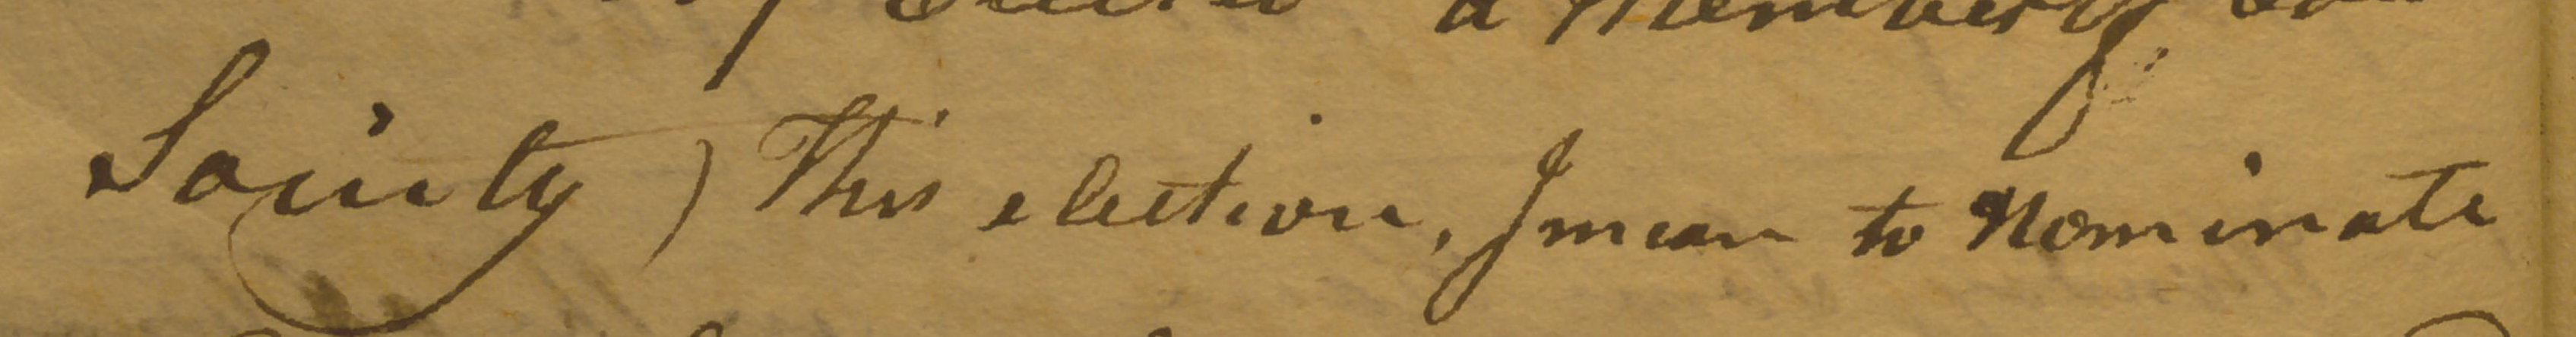Society, This election, I mean to Nominate
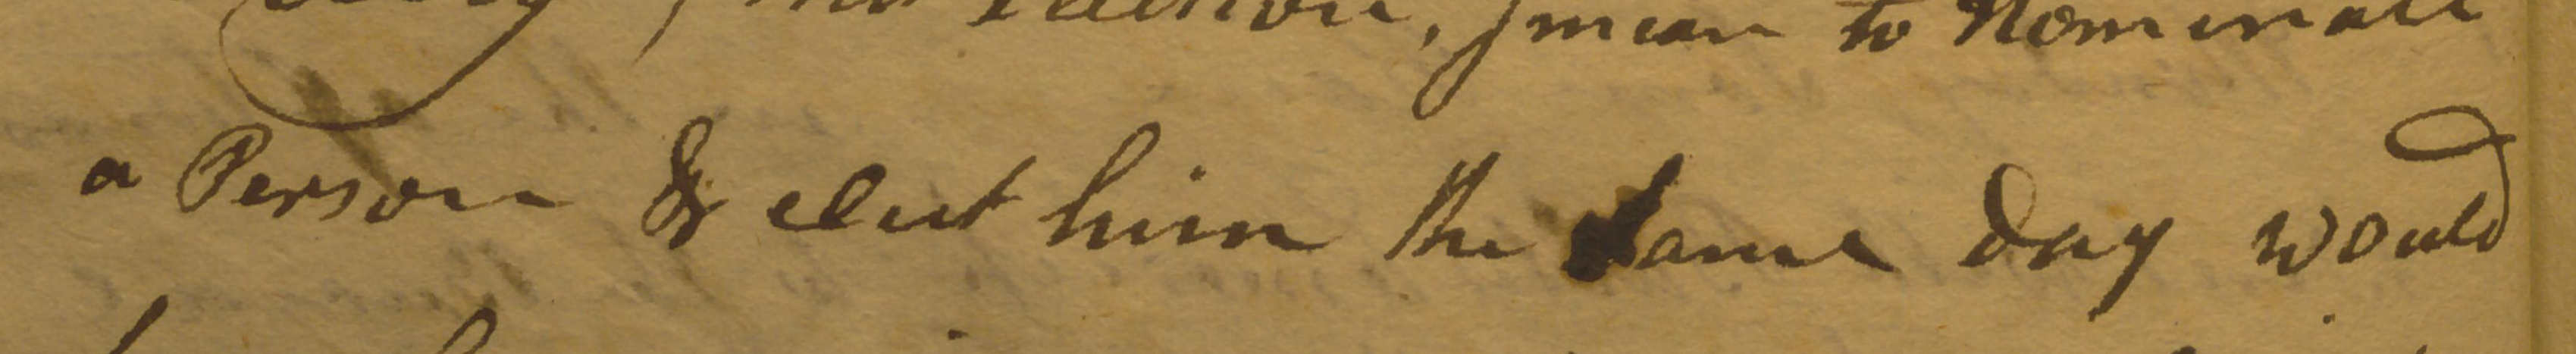a Person & elect him the same day would
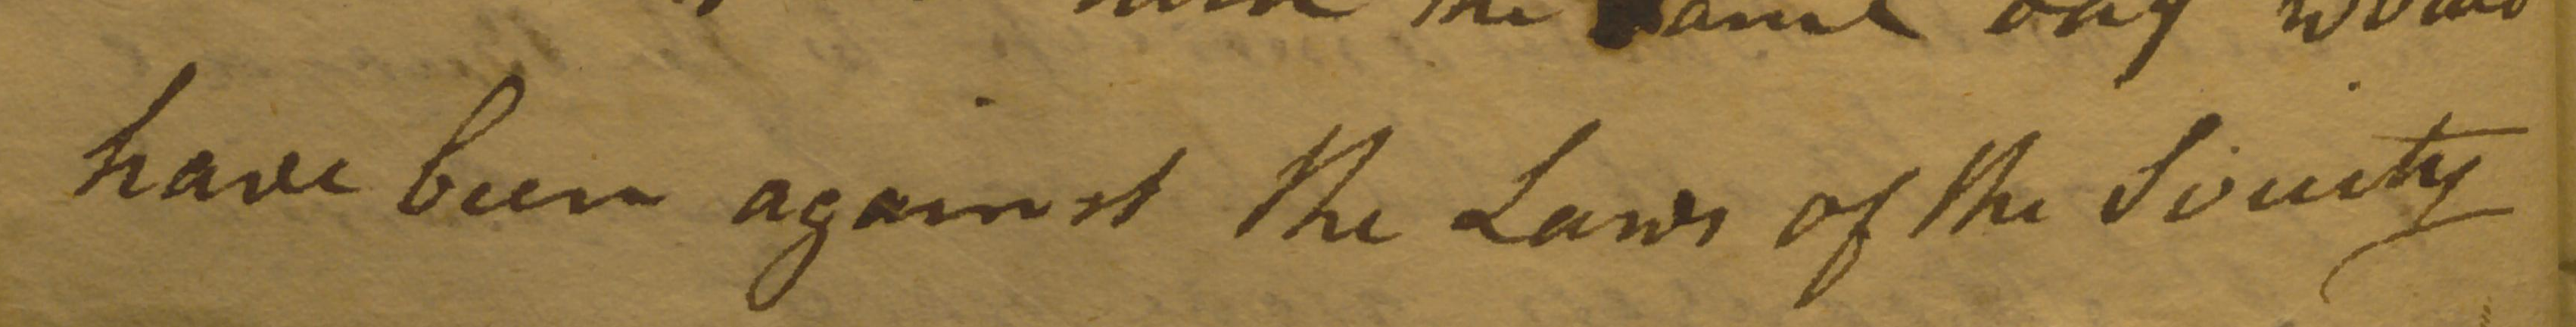have been against the Laws of the Society
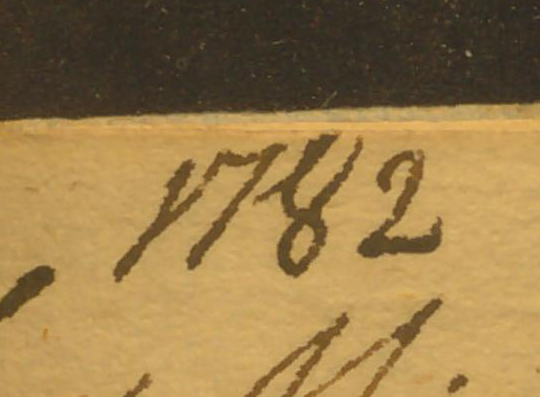1782
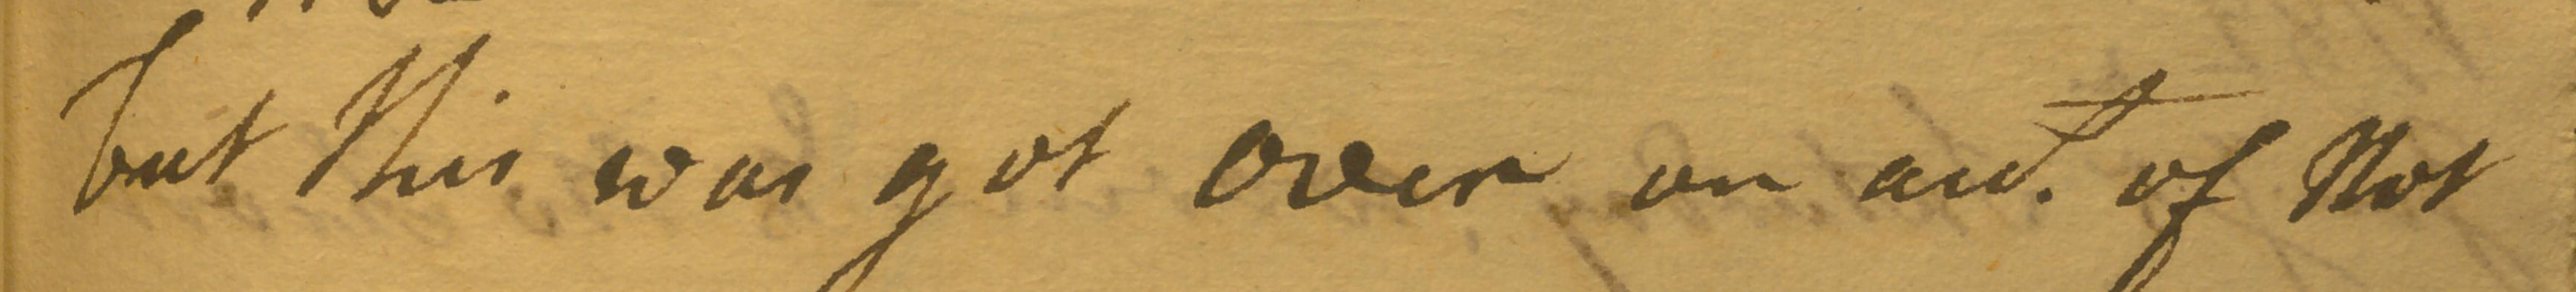but this was got over on acc^t. of Not
